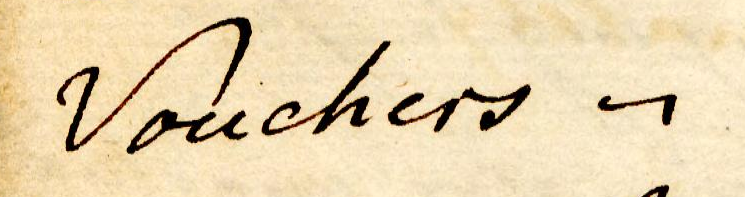Vouchers.
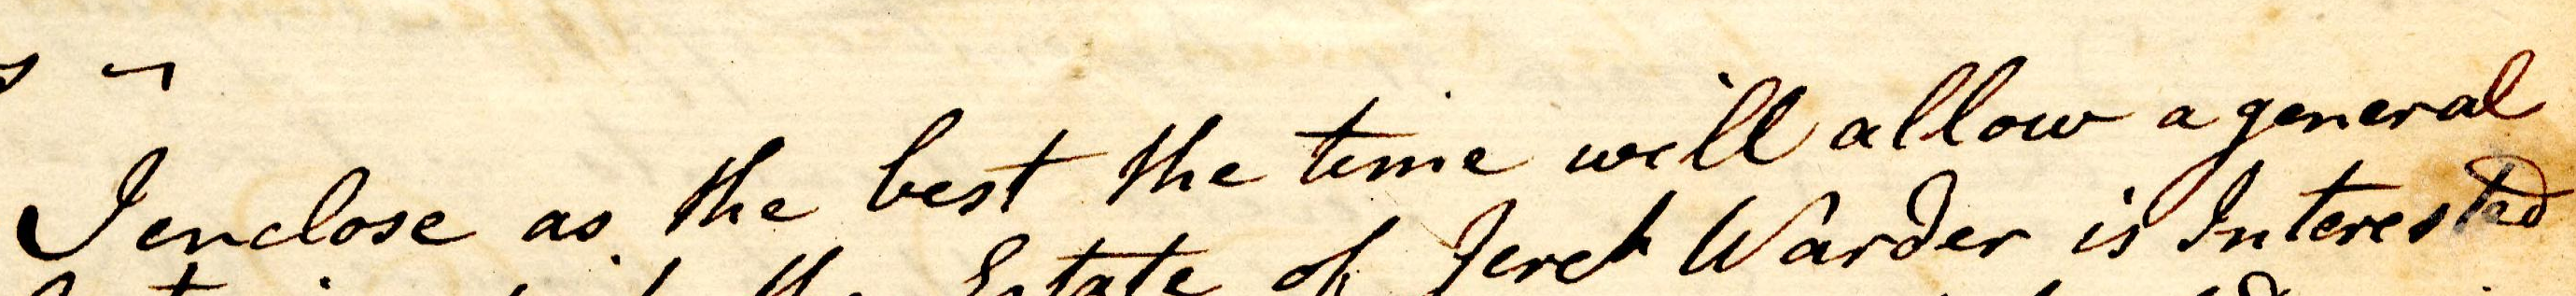I enclose as the best the time will allow a general
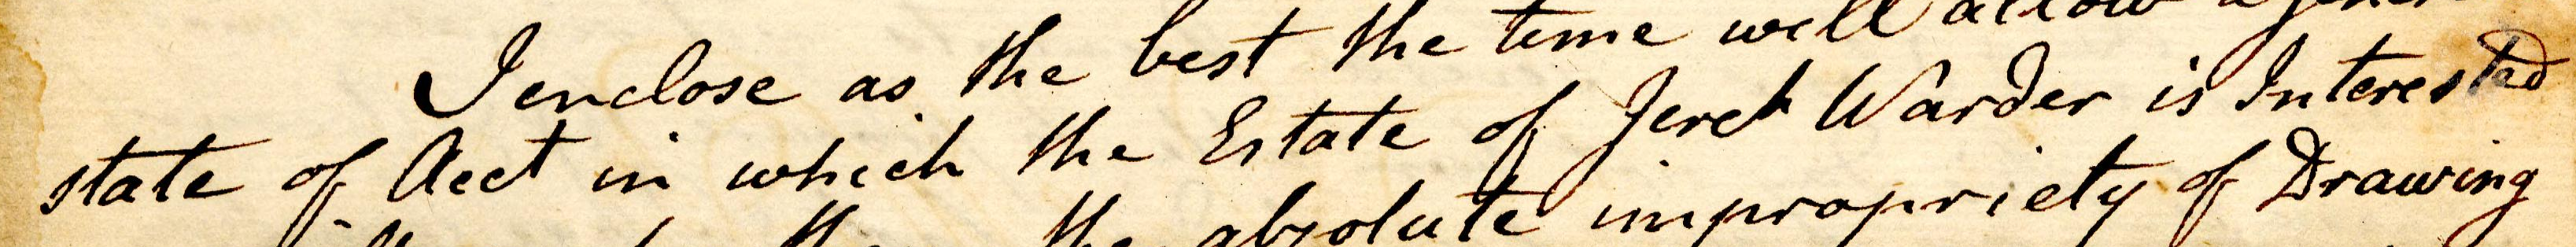state of Acct in which the Estate of Jere^h Warder is Interested
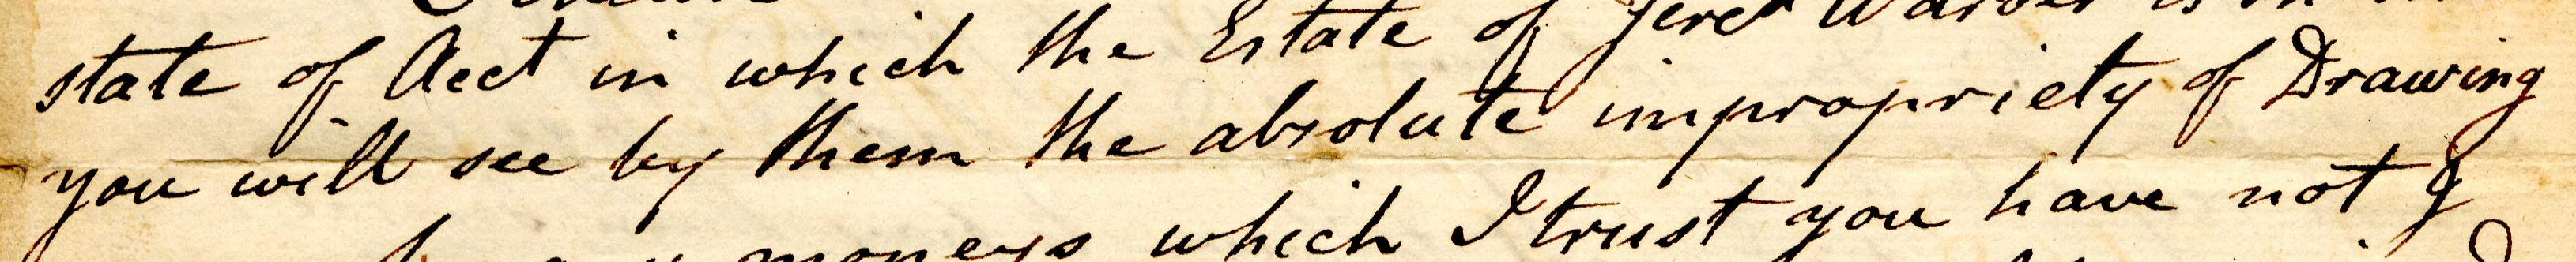you will see by them the absolute impropriety of Drawing
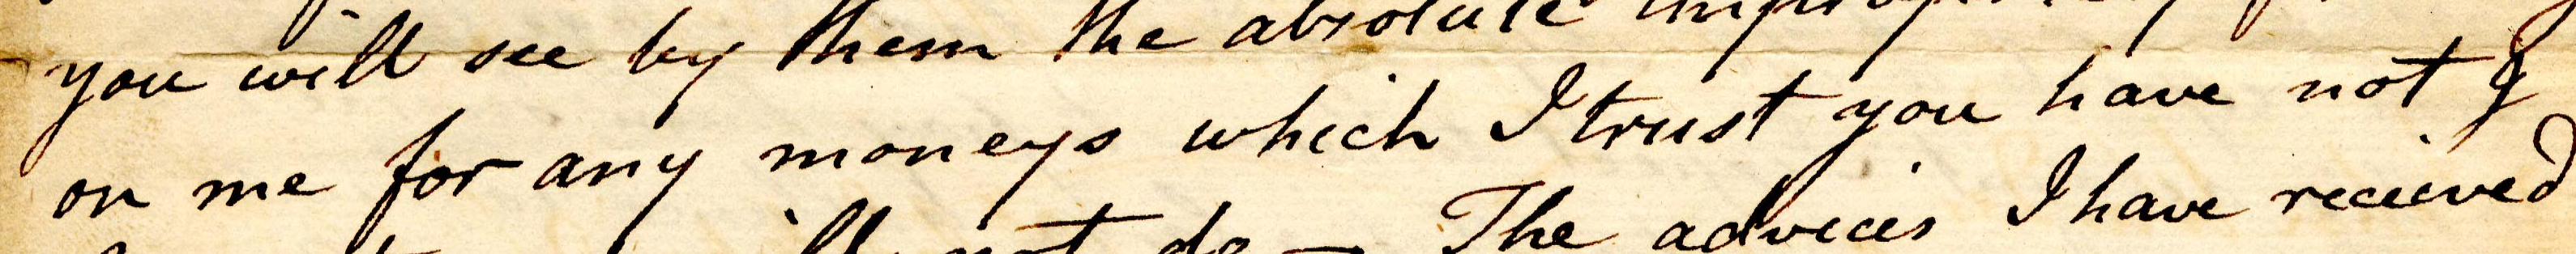on me for any moneys which I trust you have not &
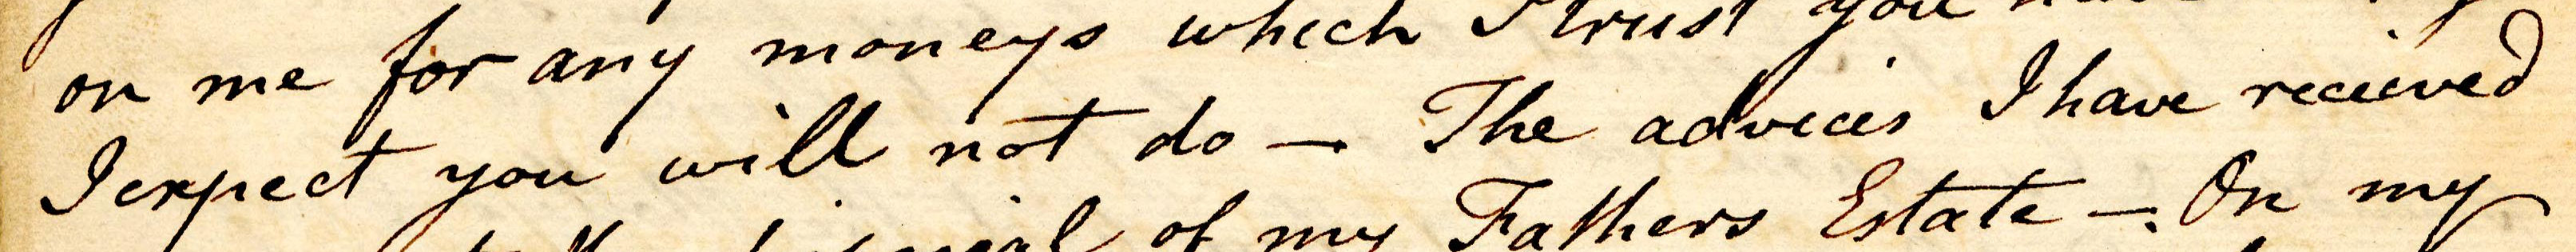I expect you will not do. The advices I have received
